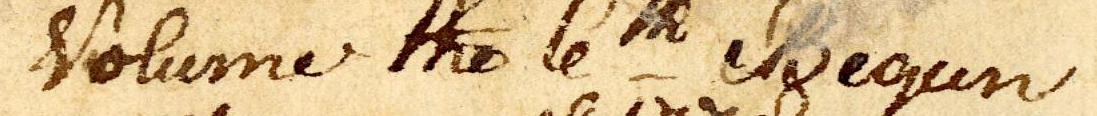Volume the 6^th Begun
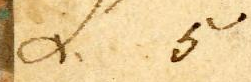d. 5
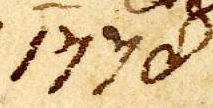1778
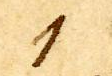1
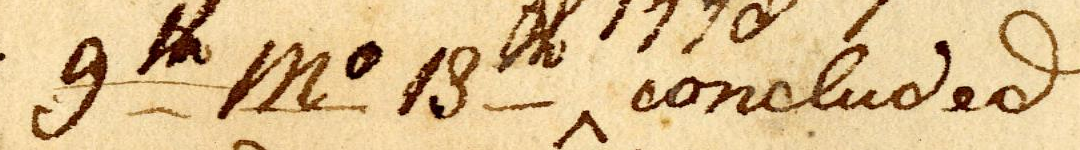9^th M^o 13^th, ^ concluded
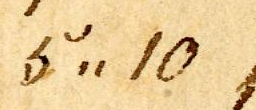5 .. 10
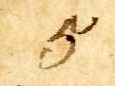5
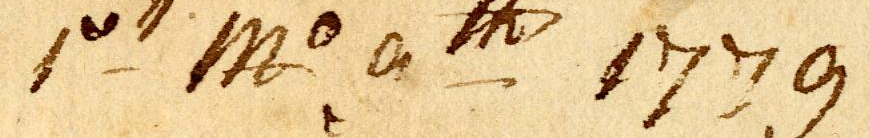1^st M^o 9^th 1779
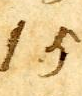15
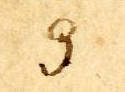3
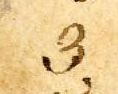3
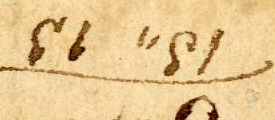13.. 13
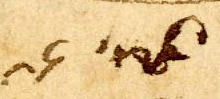5.5
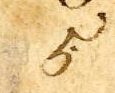5
